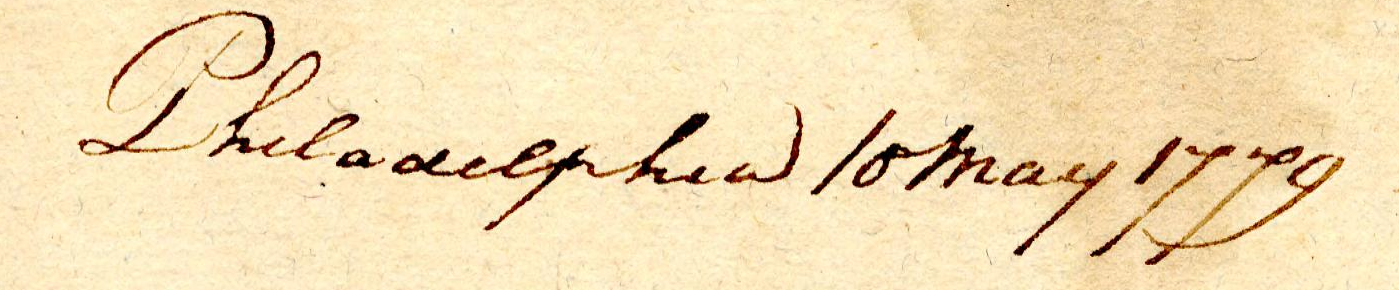Philadelphia 10 May 1779
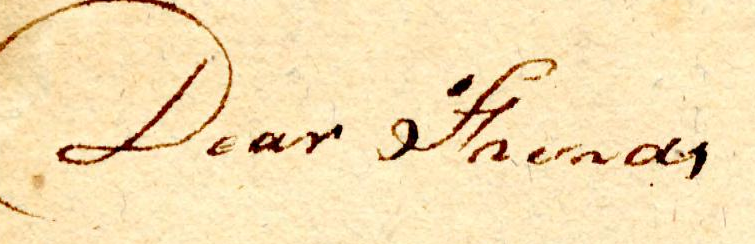Dear Friends
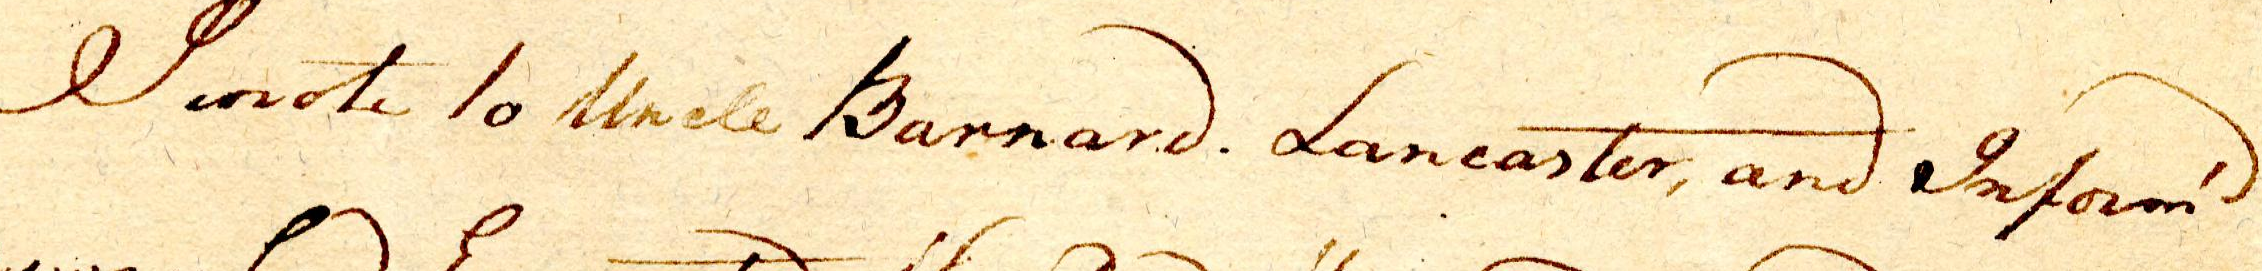I wrote to Uncle Barnard. Lancaster, and Inform'd
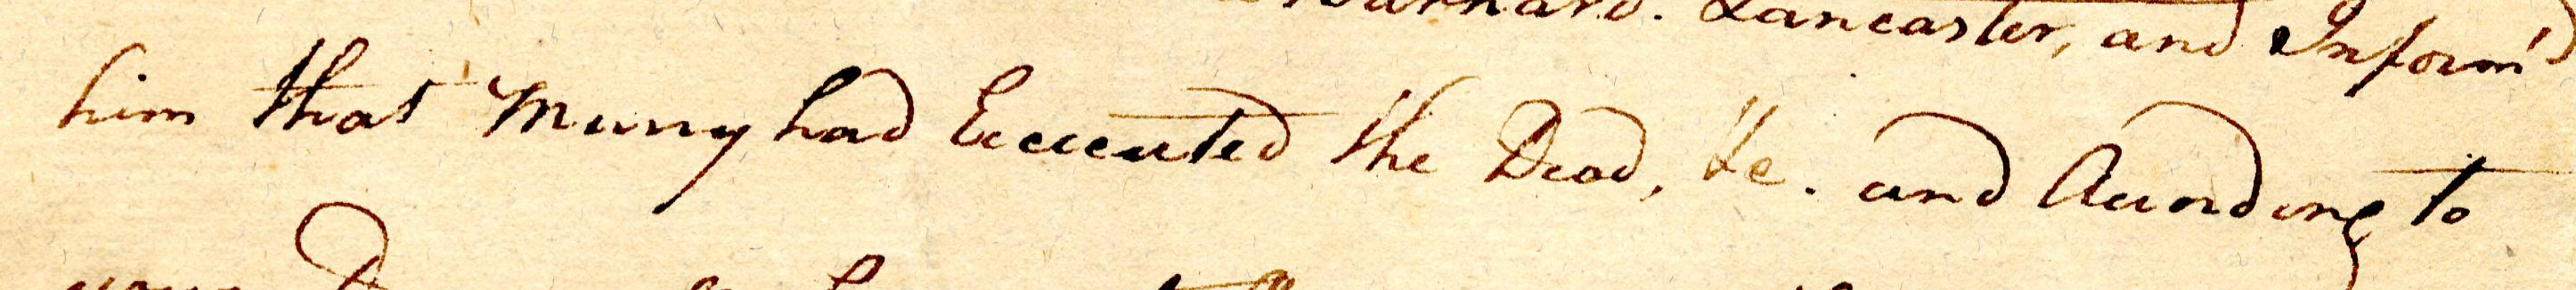him that Murry had Executed the Deed, &c. and According to
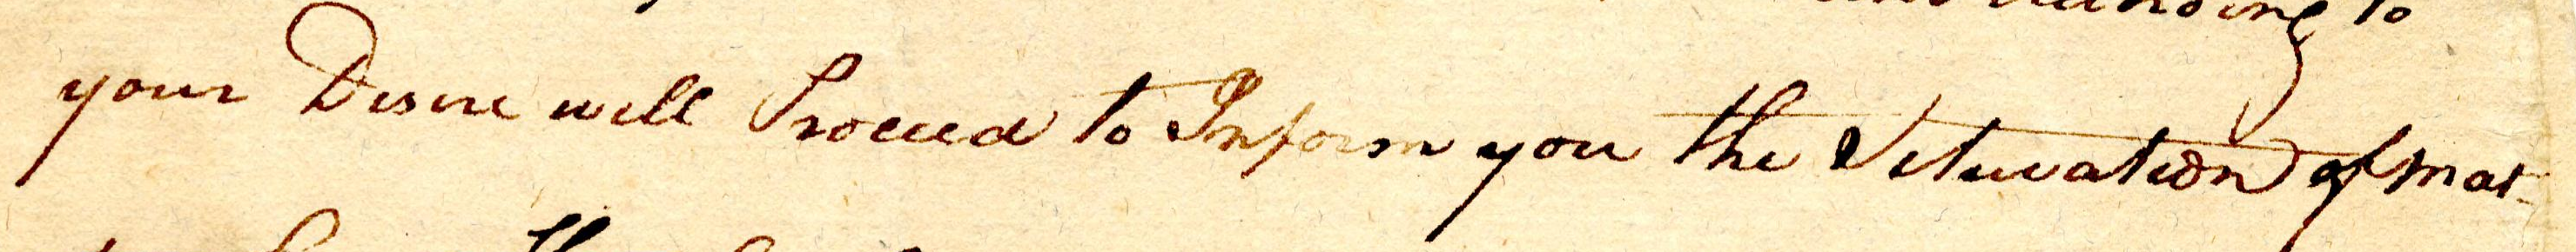Your Desire will proceed to Inform you the situation of mat-
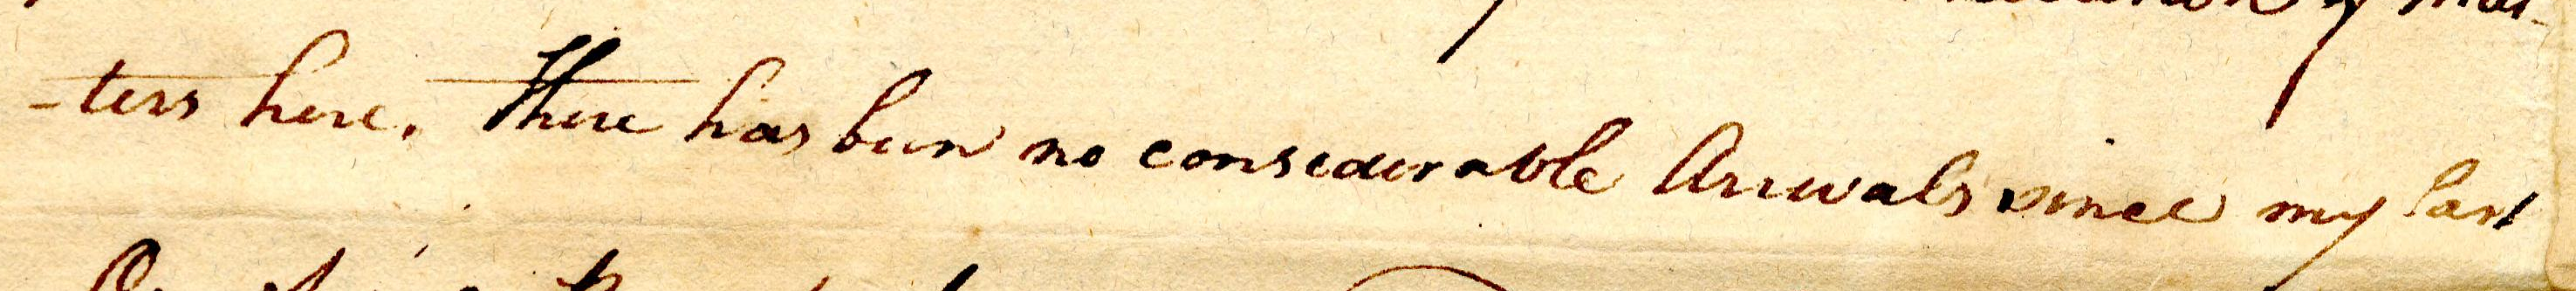-ters here. There has been no consederable Arrivals since my part
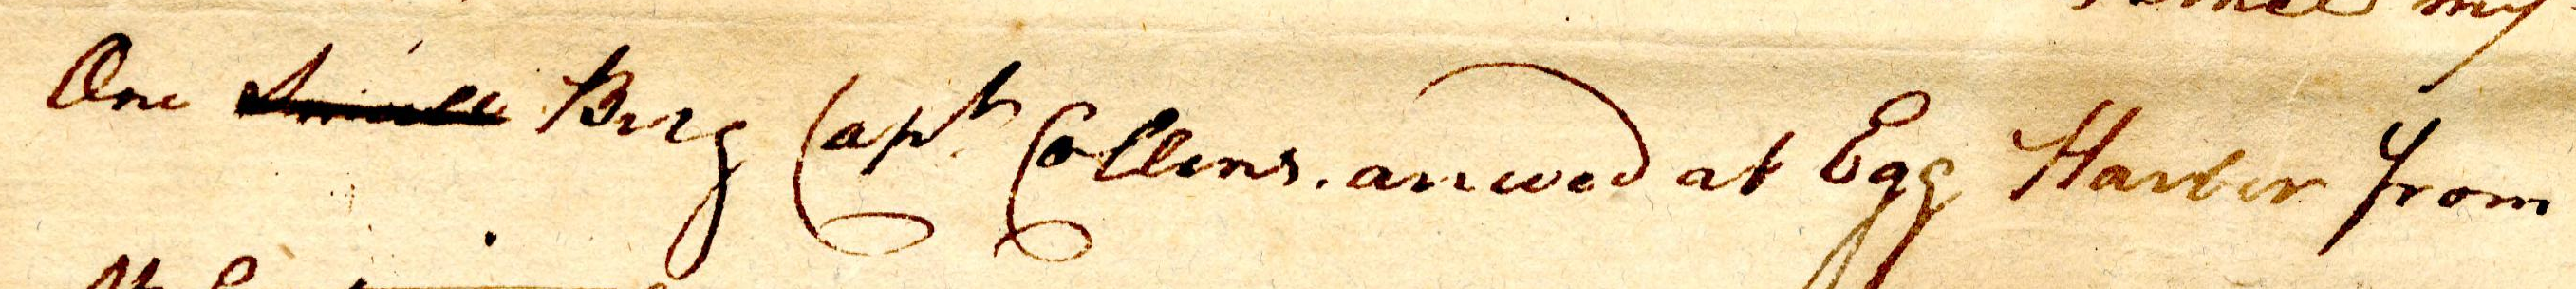One [_____] Brig Cap^t. Collins, arriwed at Egs Harbor from
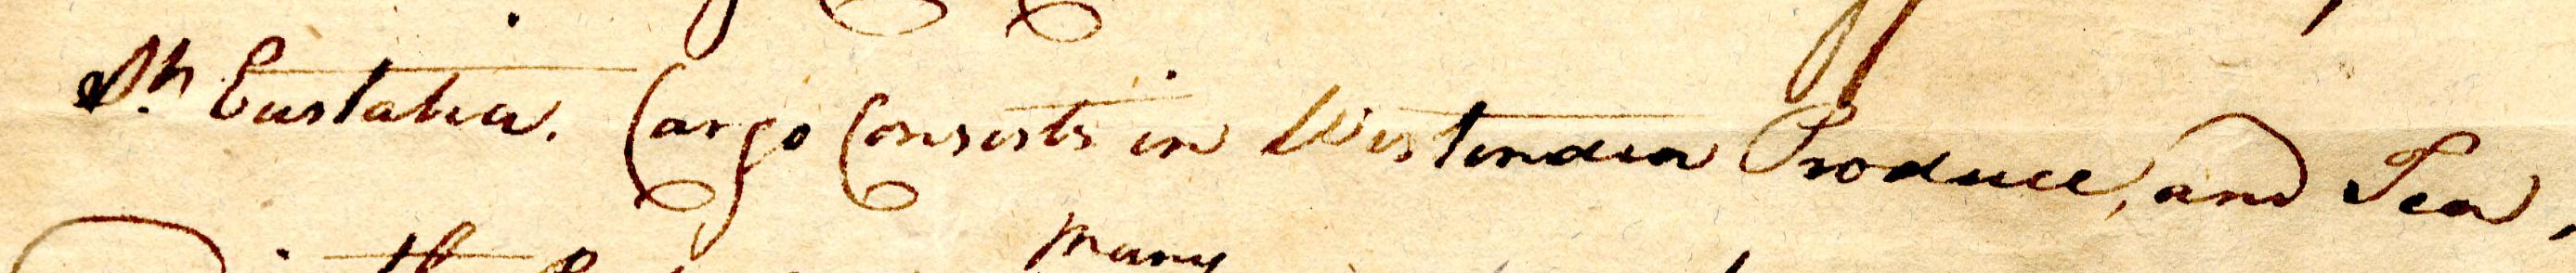S^t Eustatia, Cargo Consests in Wistendia Produce, and Sead
